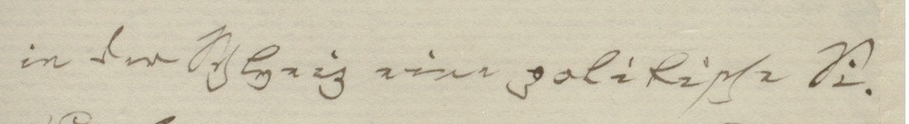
in der Schweiz eine politische Si-
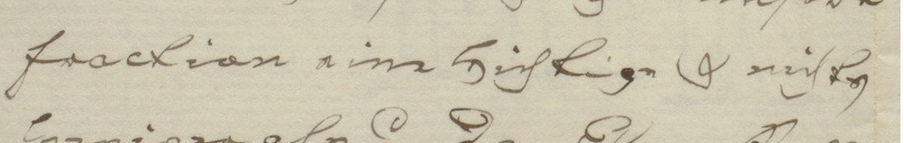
Fraction eine wichtige & nichts
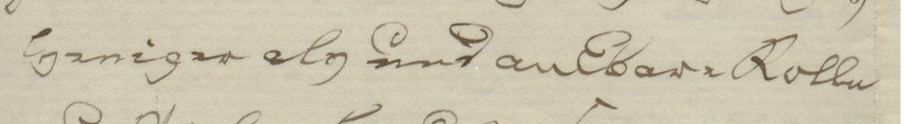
weniger als undankbare Rolle
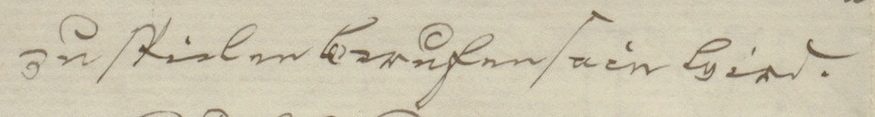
zu spielen berufen sein wird.
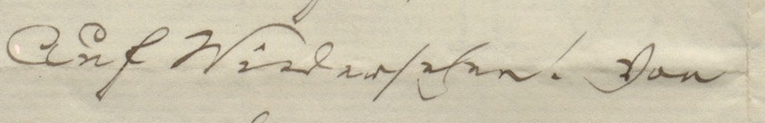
Auf Wiedersehen. Von
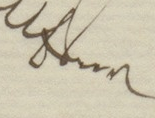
Dein
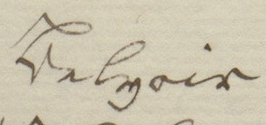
Belvoir
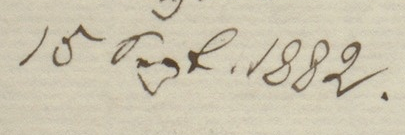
15 Sept. 1882.
